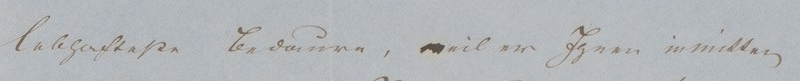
lebhafteste bedaure, weil er Ihnen inmitten
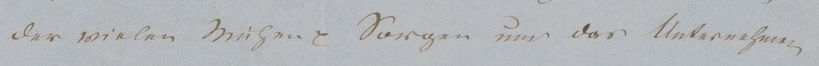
der vielen Mühen & Sorgen um das Unternehmen
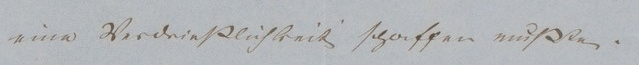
eine Verdrießlichkeit schaffen mußte.
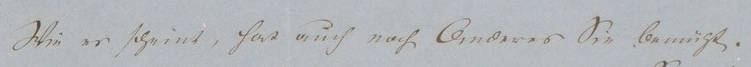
Wie es scheint, hat auch noch Anderes Sie bemüht.
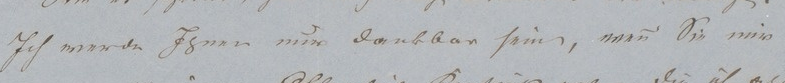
Ich werde Ihnen nur dankbar sein, wenn Sie mir
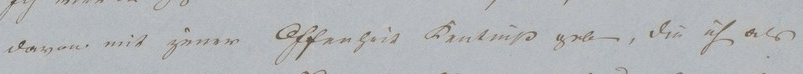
davon mit jener Offenheit Kentniß geben, die ich als
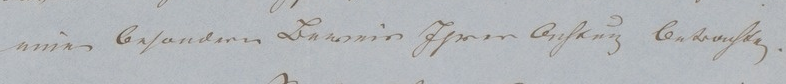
einen besondern Beweis Ihrer Achtung betrachte.
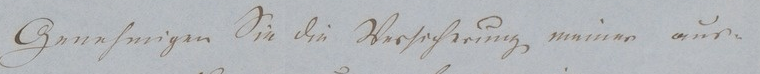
Genehmigen Sie die Versicherung meiner aus-
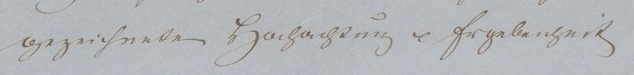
gezeichneten Hochachtung & Ergebenheit
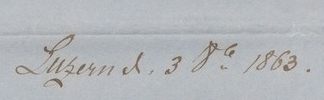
Luzern d. 3 8b 1863.
